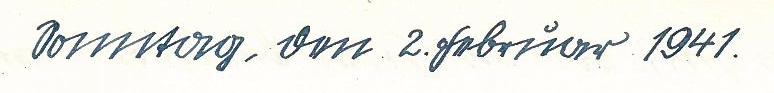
Sonntag, den 2. Februar 1941.
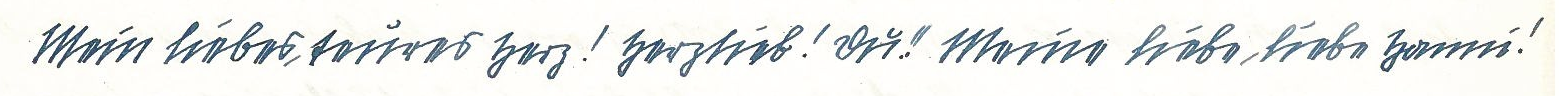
Mein liebes, teures Herz! Herzlieb! Du!! Meine liebe, liebe!
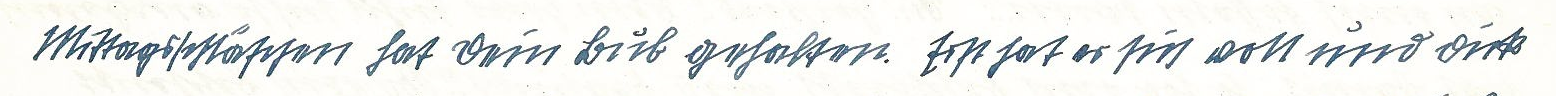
Mittagsschläfchen hat Dein Bub gehalten. Erst hat er sich voll und dick
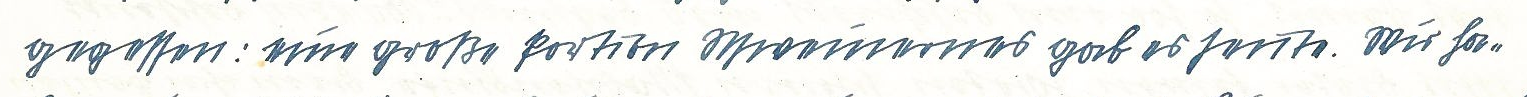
gegessen: eine große Portion Schweinernes gab es heute. Wir ha¬
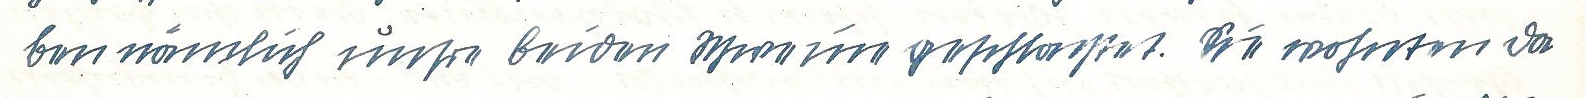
ben nämlich unsere beiden Schweine geschlachtet. Sie wohnten da
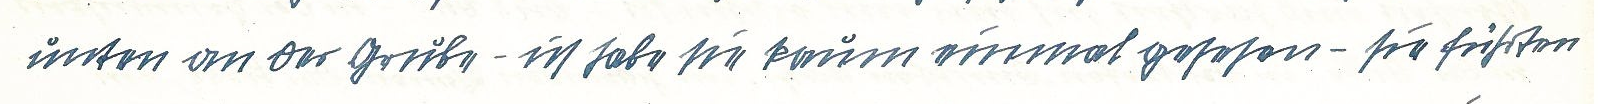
unten an der Grube – ich habe sie kaum einmal gesehen – sie führten
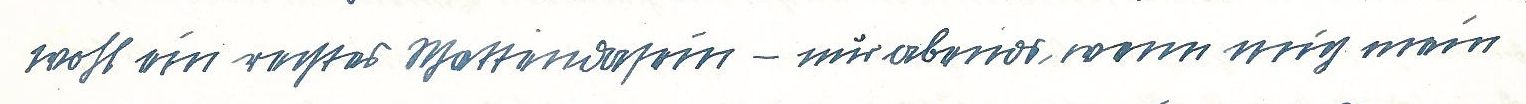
wohl ein rechtes Schattendasein – nur abends, wenn mich mein
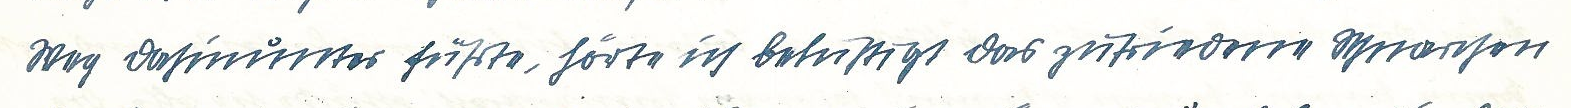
Weg da hinunter führte, hörte ich belustigt das zufriedene Schnarchen
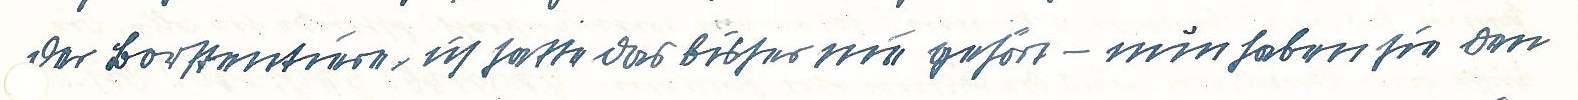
der Borstentiere, ich hatte das bisher nie gehört – nun haben sie den
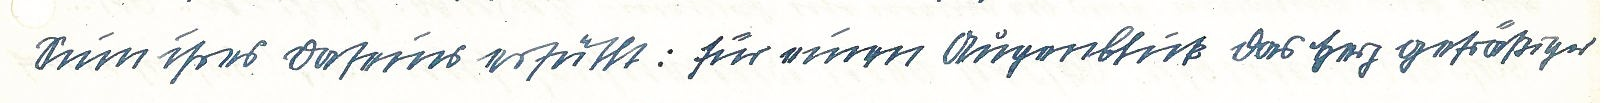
Sinn ihres Daseins erfüllt: für einen Augenblick das Herz gefräßiger
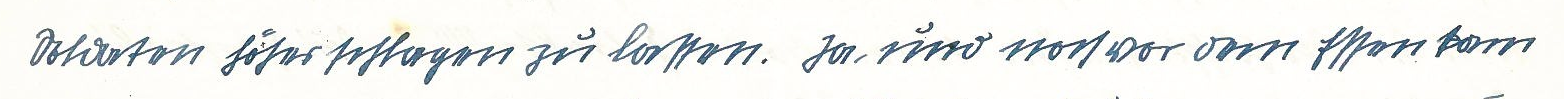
Soldaten höher schlagen zu lassen. Ja, und noch vor dem Essen kam
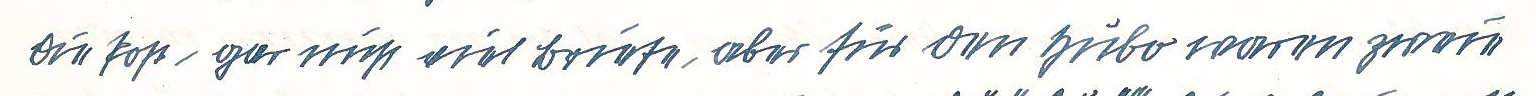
die Post, gar nicht viel Briefe, aber für den Hubo waren zweie
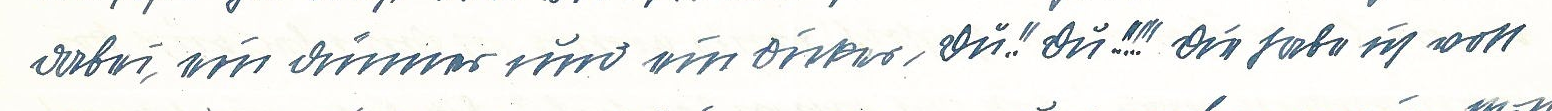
dabei, ein dünner und ein dicker, Du!! Du!!!!! Die habe ich voll
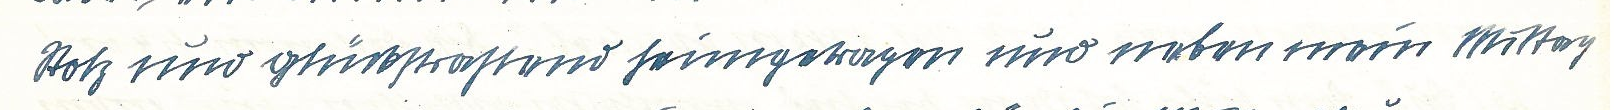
Stolz und glückstrahlend heimgetragen und neben mein Mittag
